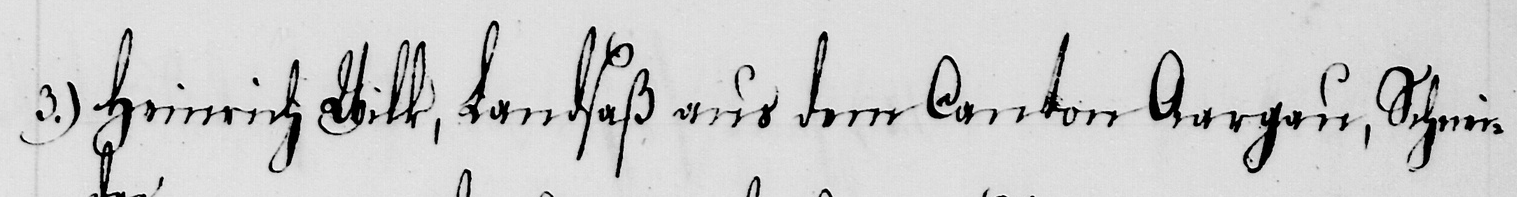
3.) Heinrich Wilk, Landfaß aus dem Canton Aargau, Schnei¬
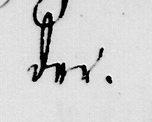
der.
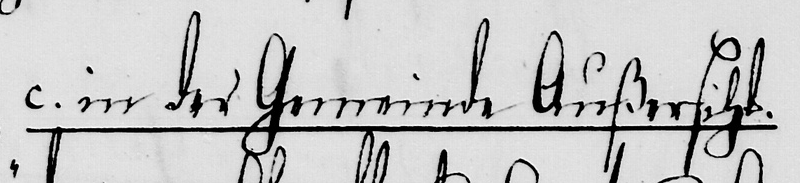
c. in der Gemeinde Außersihl.
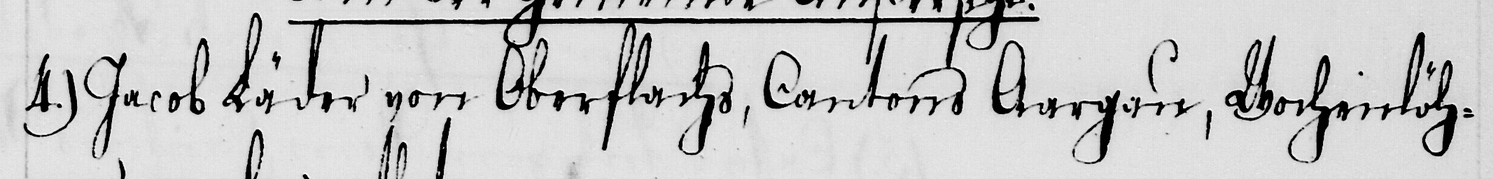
4.) Jacob Läder von Oberflachs, Cantons Aargau, Wochenlöh¬
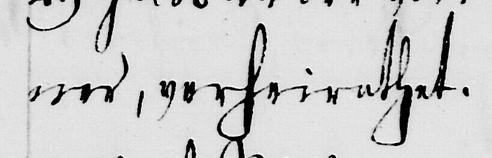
ner, verheirathet.
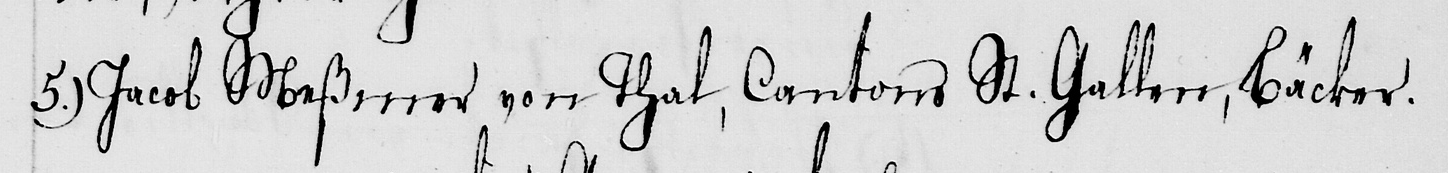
5.) Jacob Meßmer von Thal, Cantons St. Gallen, Bäcker.
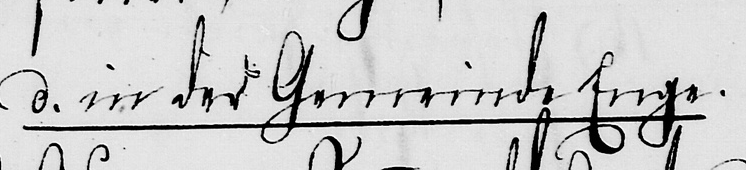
d. in der Gemeinde Enge.
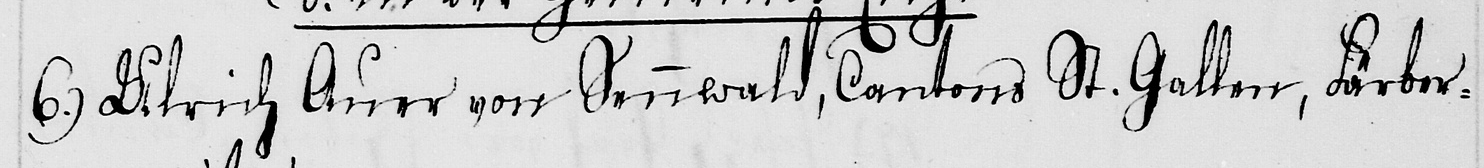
6.) Ulrich Auer von Sennwald, Cantons St. Gallen, Färber¬
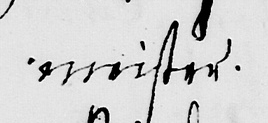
meister.
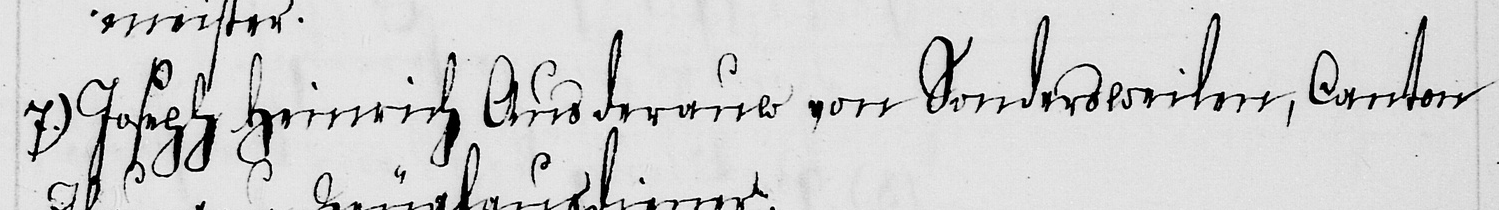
7.) Joseph Heinrich Ausderauw von Sondersweilen, Canton
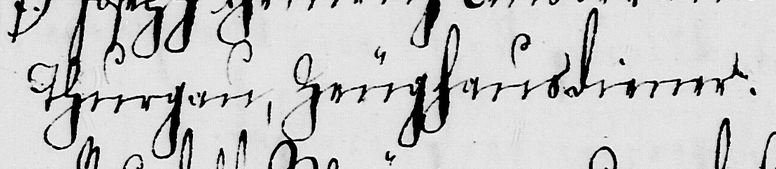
Thurgau, Zeughausdiener.
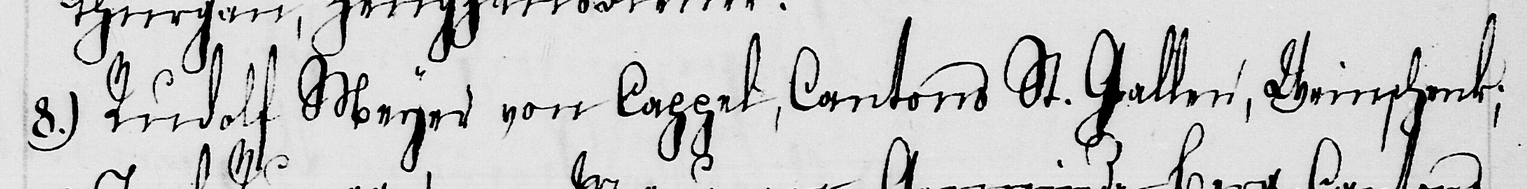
8.) Rudolf Meyer von Cappel, Cantons St. Gallen, Weinschenk;
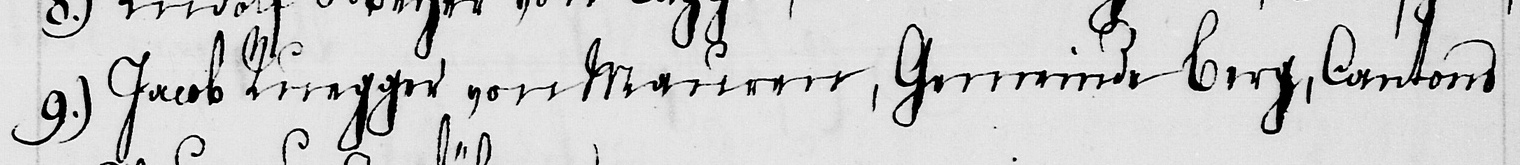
9.) Jacob Ruegger von Mauren, Gemeinde Berg, Cantons
